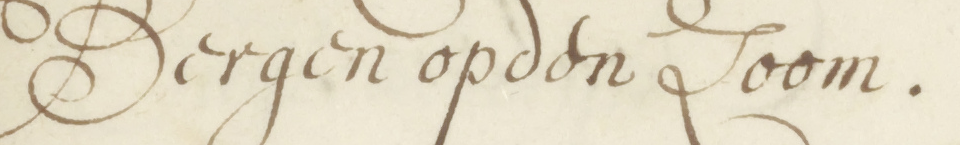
Bergen opden Zoom.
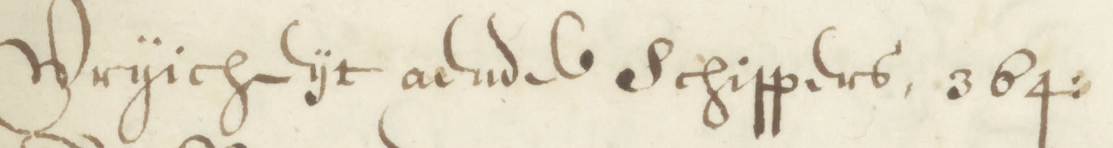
Vrijicheijt aende Schippers, 364:
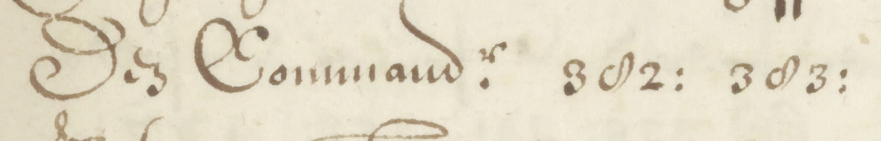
Den Commandr. 382: 383:
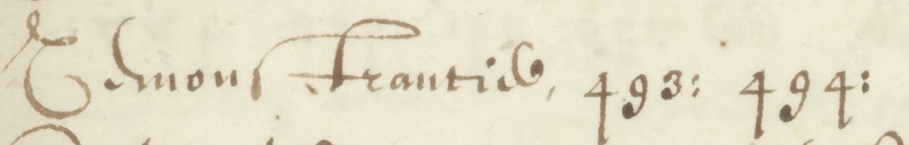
Remonstrantie, 493: 494:
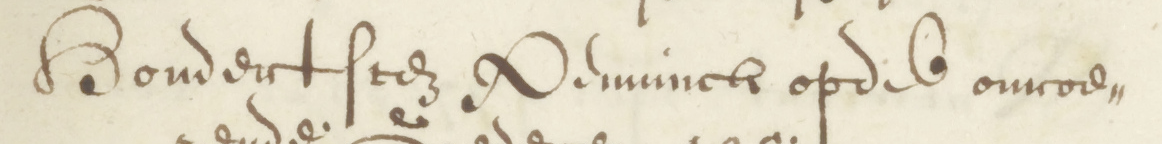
Hondertsten Penninck opde onroe„
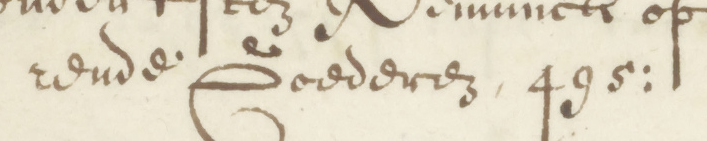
rende Goederen, 495:
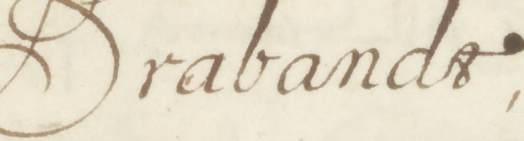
Brabandt,
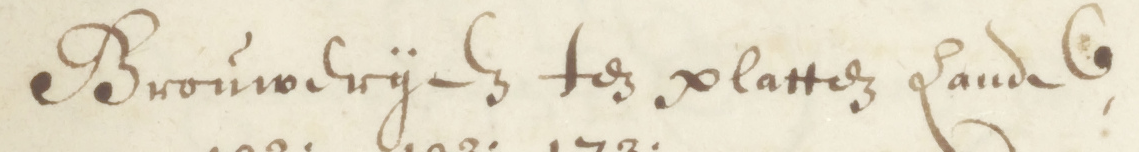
Brouwerijen ten platten Lande,
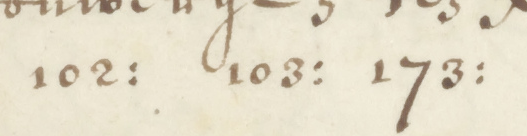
102: 103: 173:
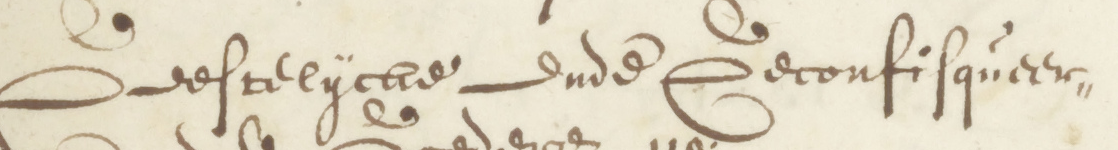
Geestelijcke ende Geconfisqueer„
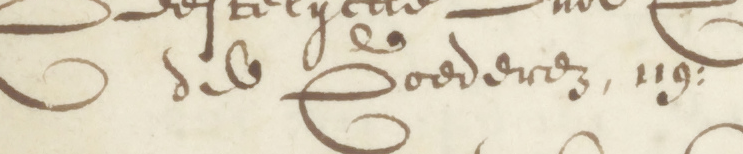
de Goederen, 119:
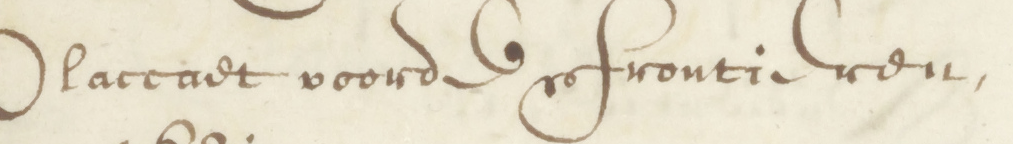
Placcaet voorde frontieren,
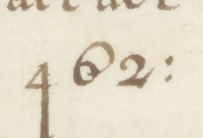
462:
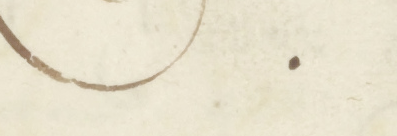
C.
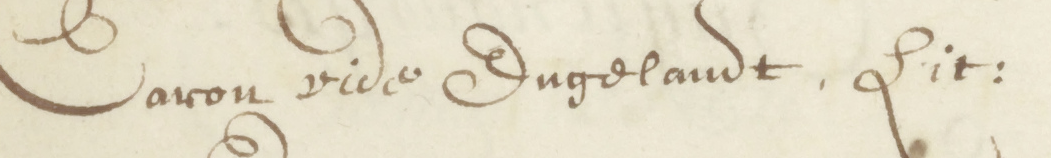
Caron vide Engelandt, Lit:
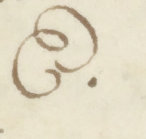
E.
